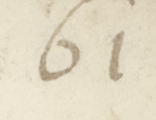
61
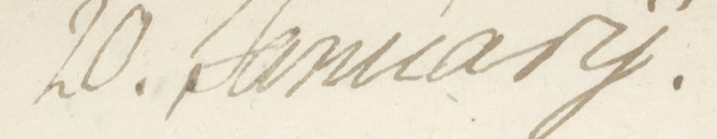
20. Januarij.
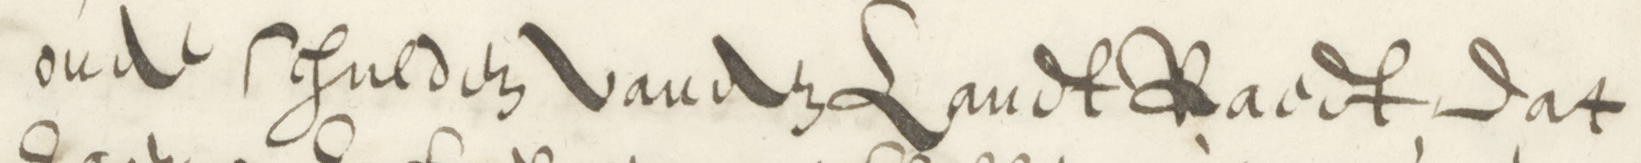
oude schulden vanden Landt Raedt, dat
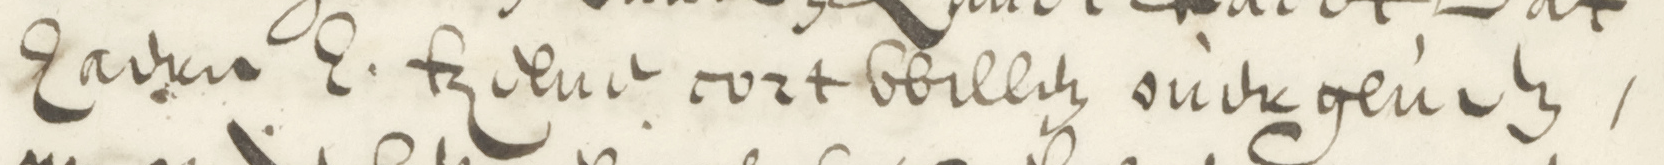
haere E. tzelue cort willen ouergeuen,
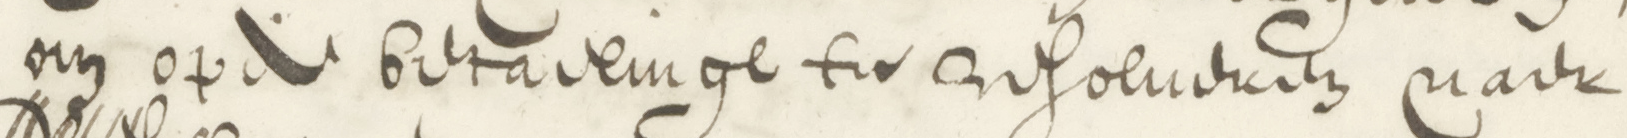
om op de betaelinge te resolueren naer
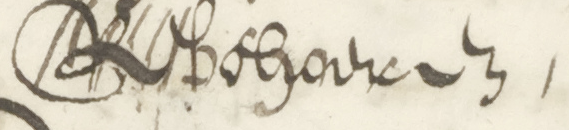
Rbehoeren.
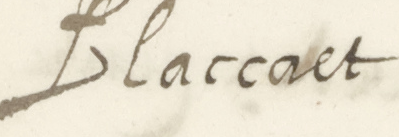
Placcaet
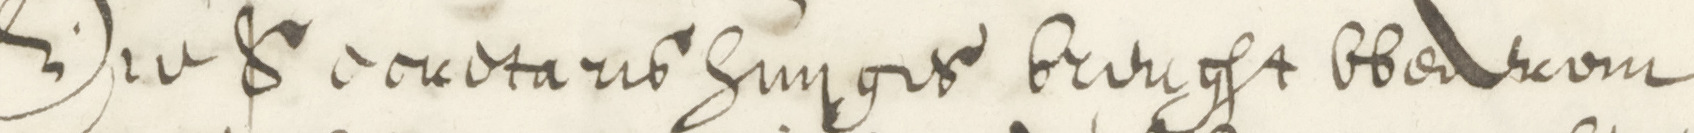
Die Secretaris Huyges brenght wederom
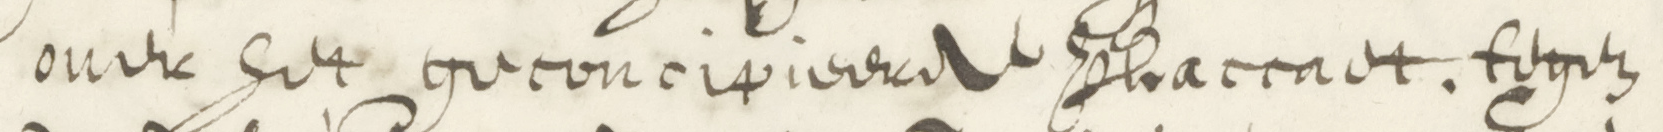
ouer het geconcipieerde Placcaet. tegen
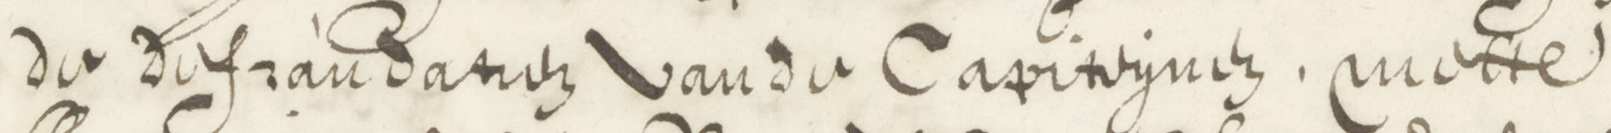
de defraudatien vande Capiteijnen, mette
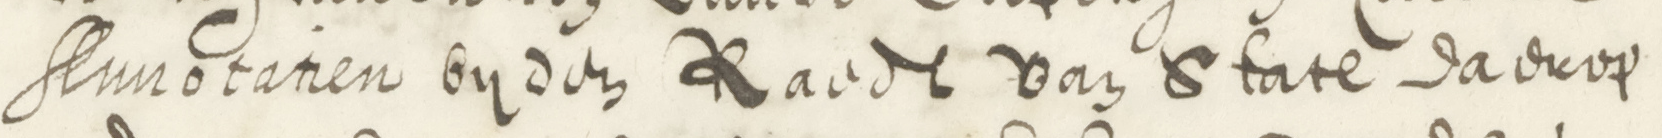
Annotatien by den Raedt van State daerop
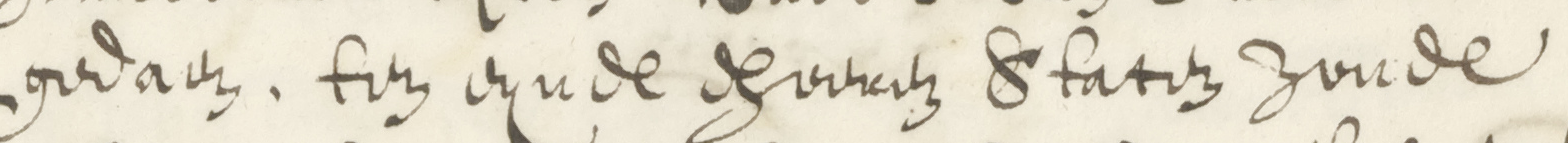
gedaen, ten eynde d'heeren Staten zoude
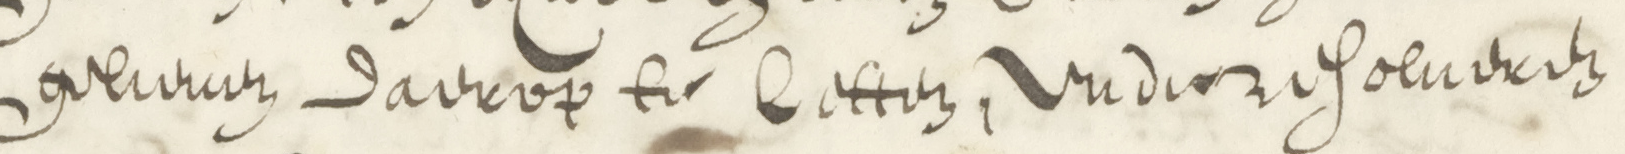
gelieuen daerop te letten, ende resolueren
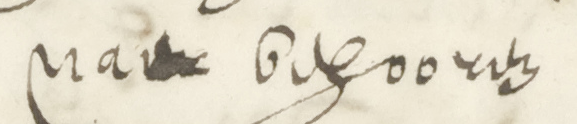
naer behooren
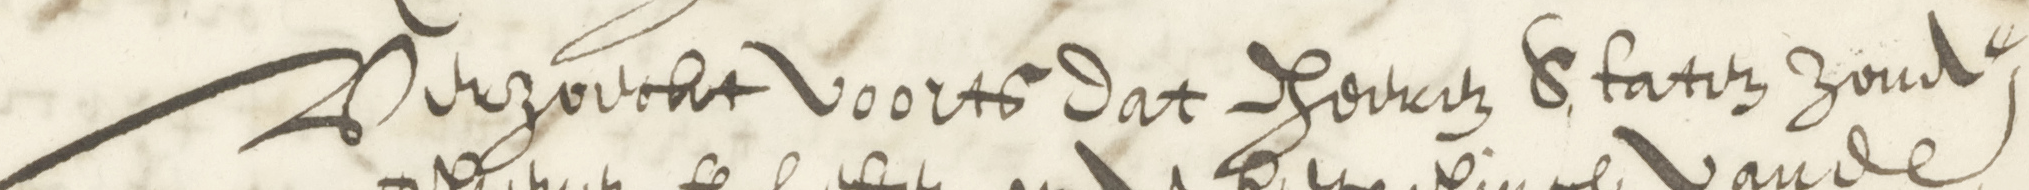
Verzoeckt voorts dat dheeren Staten zoude
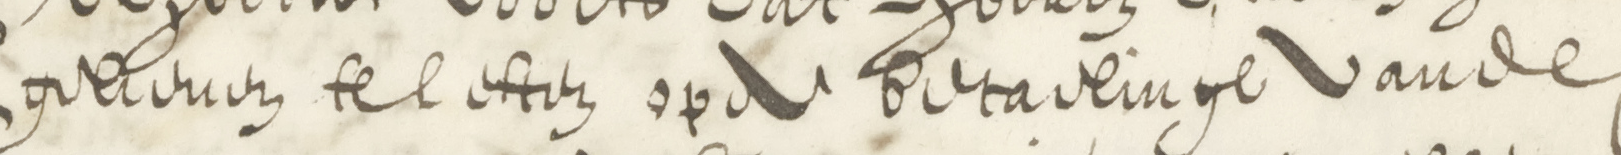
gelieuen te letten opde betaelinge vande
